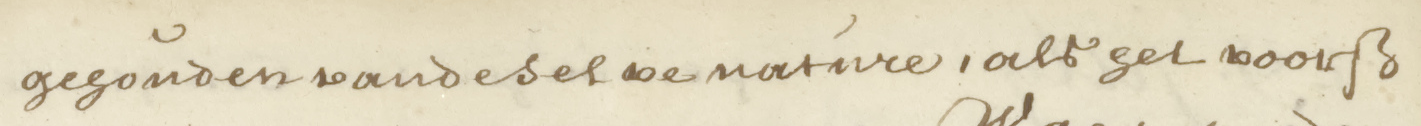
gehouden vande selve nature, als het voors.
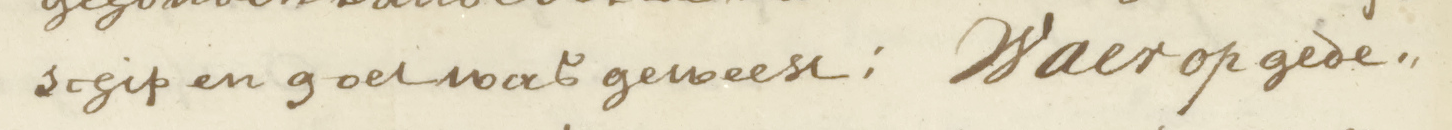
schip en goet was geweest: Waerop gede„
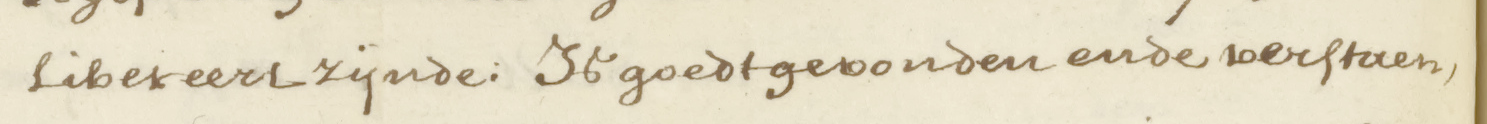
libereert zijnde: Is goedtgevonden ende verstaen,
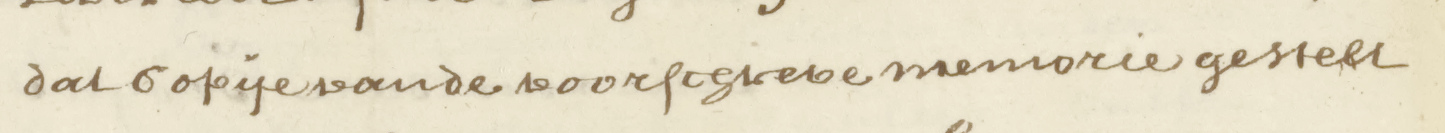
dat copije vande voorschreve memorie gestelt
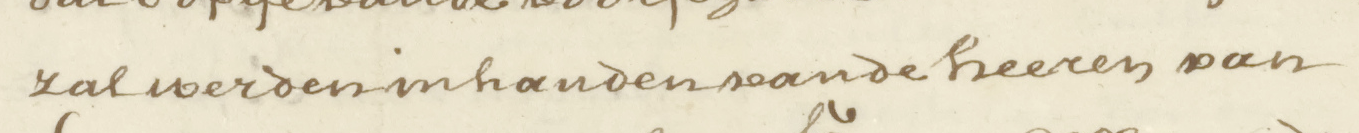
zal werden in handen vande heeren van
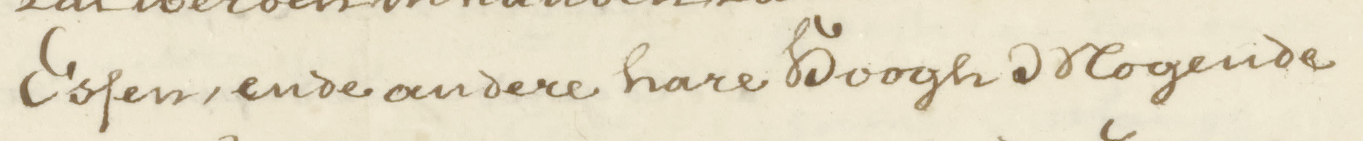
Essen, ende andere hare Hoogh Mogende
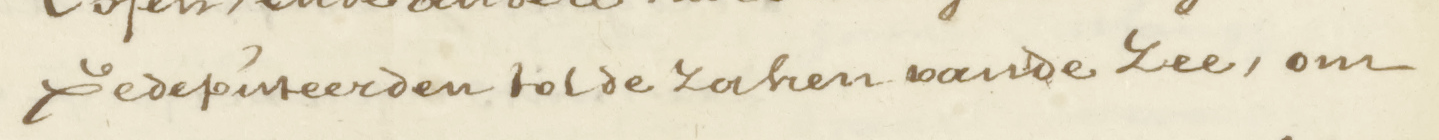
Gedeputeerden tot de zaken vande Zee, om
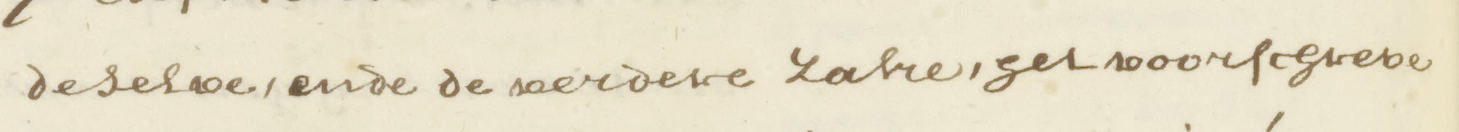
deselve, ende de verdere zake, het voorschreve
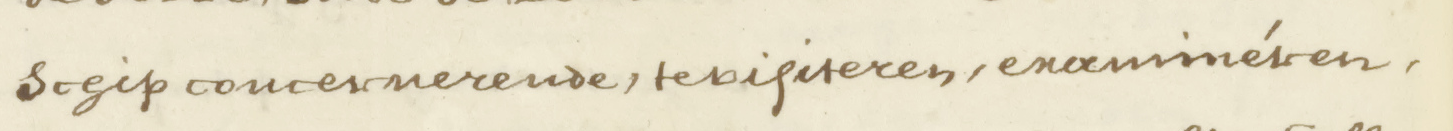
schip concernerende, te visiteren, examinéren,
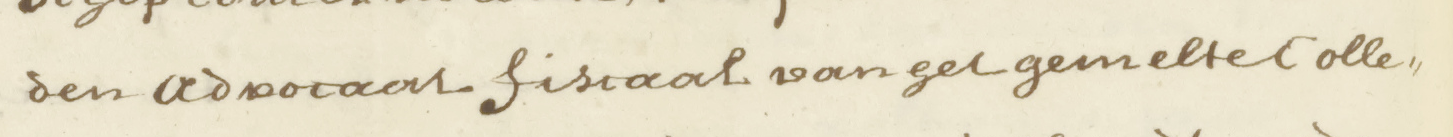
den advocaat fiscaal van het gemelte Colle„
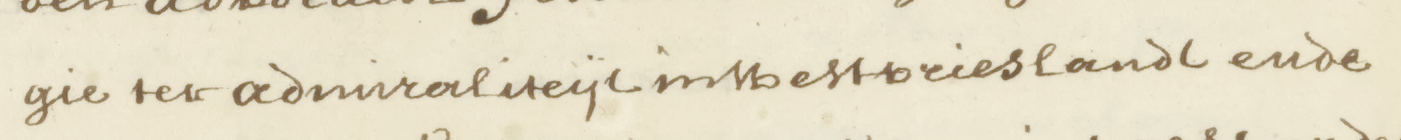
gie ter admiraliteijt in Westvrieslandt ende
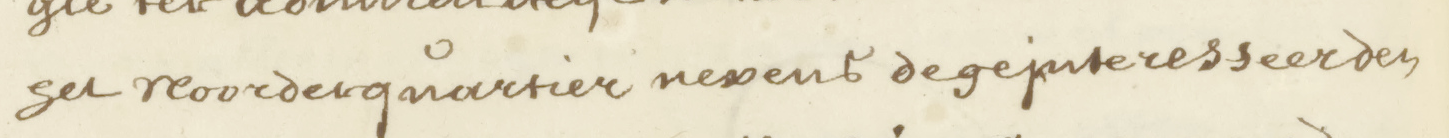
het Noorderquartier nevens de geinteresseerden
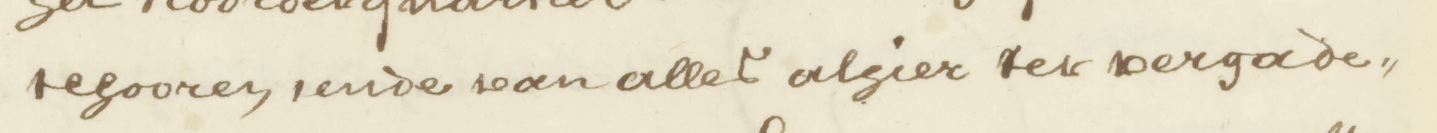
te hooren, ende van alles alhier ter vergade„
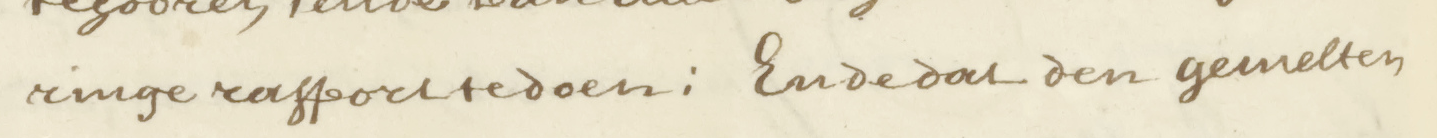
ringe rapport te doen: Ende dat den gemelten
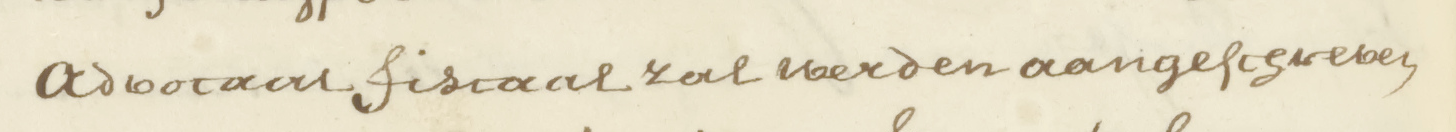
Advocaat fiscaal zal werden aangeschreven
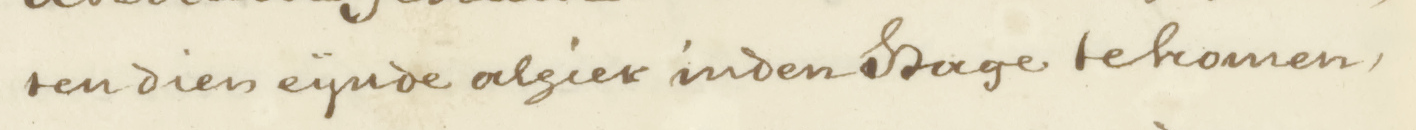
ten dien eijnde alhier inden Hage te komen,
